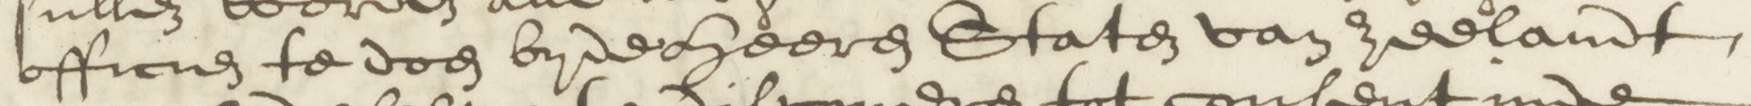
officien te doen byde Heeren Staten van zeelandt,
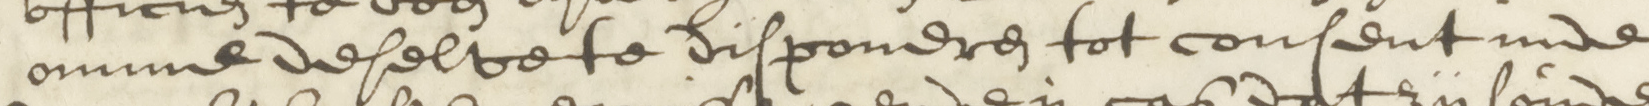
omme deselve te disponeren tot consent inde
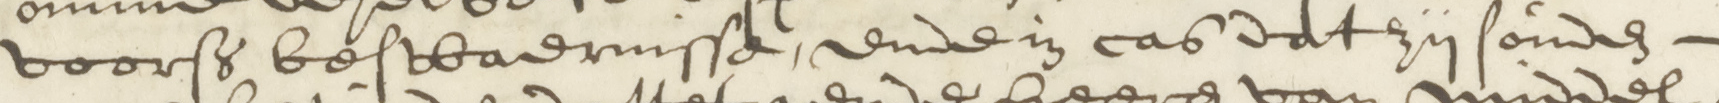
voors beswaernisse, ende in cas dat zij souden —
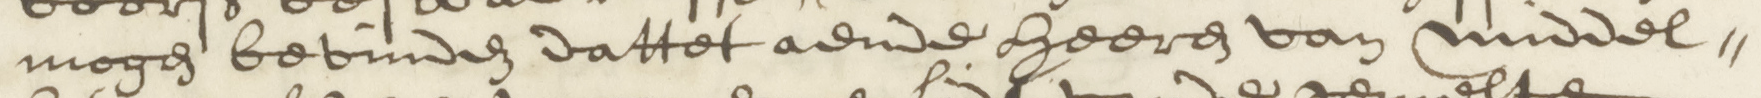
mogen bevinden dattet aende heeren van middel„
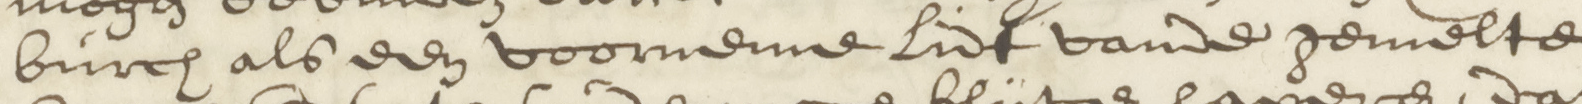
burch als een voorneme Lidt vande gemelte
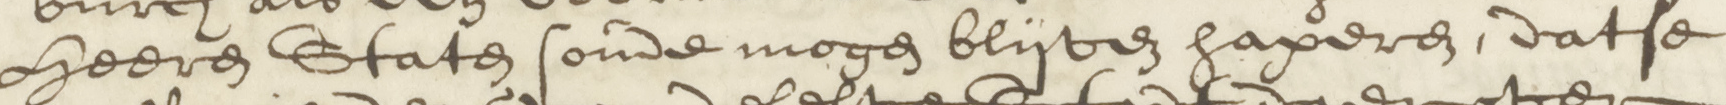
Heeren Staten soude mogen blijven haperen, datse
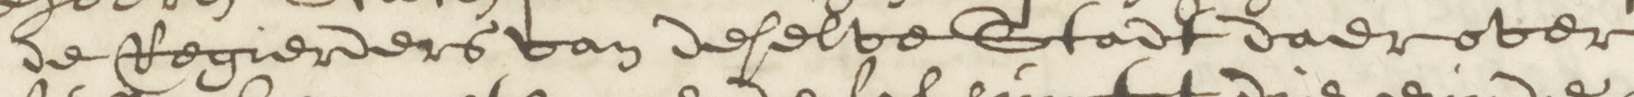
de Regierders van deselve Stadt daer over
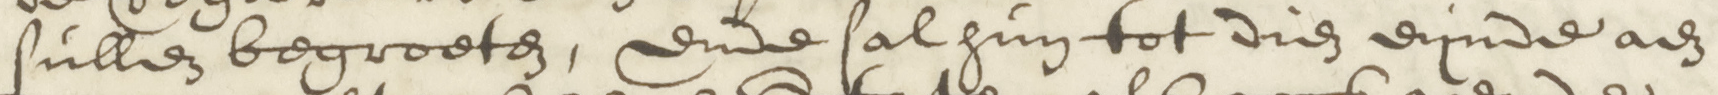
sullen begroeten, ende sal hun tot dien eijnde aen
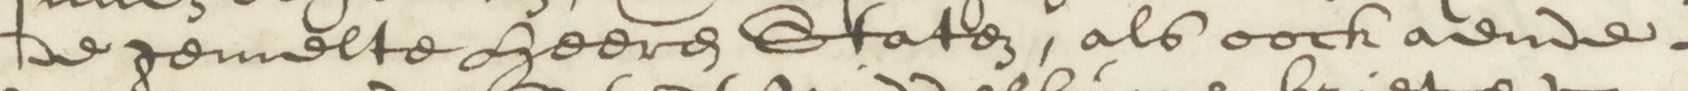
de gemelte Heeren Staten, als oock aende
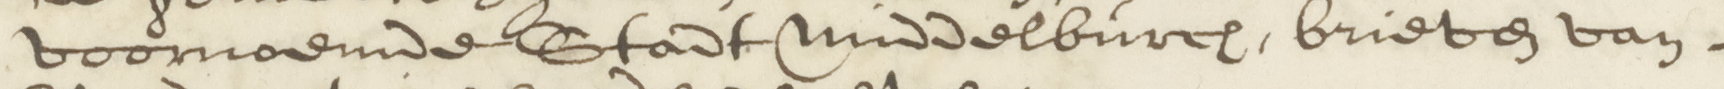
voornoemde Stadt Middelburch, brieven van
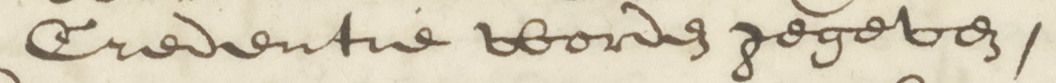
Credentie worden gegeven.
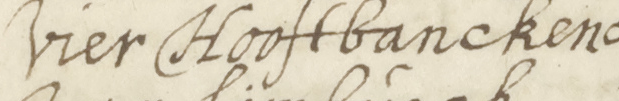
vier Hooftbancken
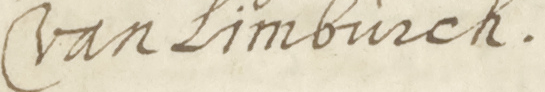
van Limburch.
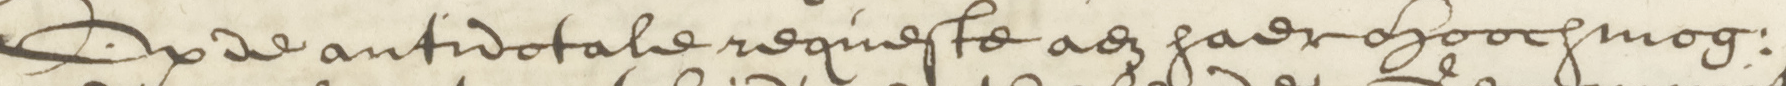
Op de antidotale requeste aen haer Hoochmog:
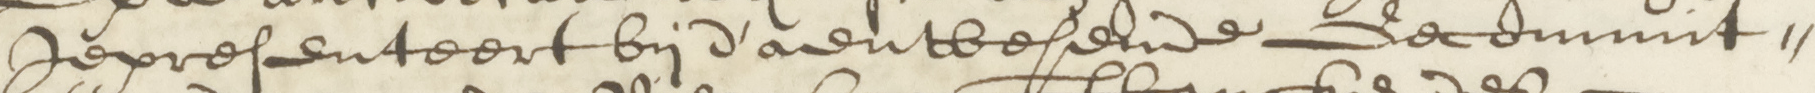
gepresenteert bij d'aenwesende Gecommit„
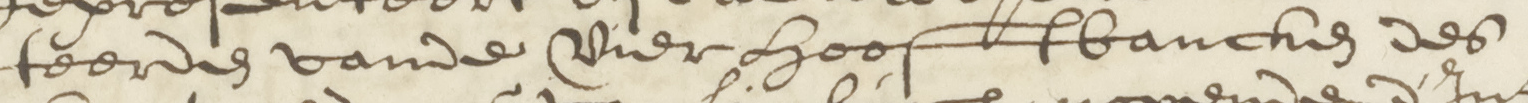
teerden vande Vier Hooftbancken des
